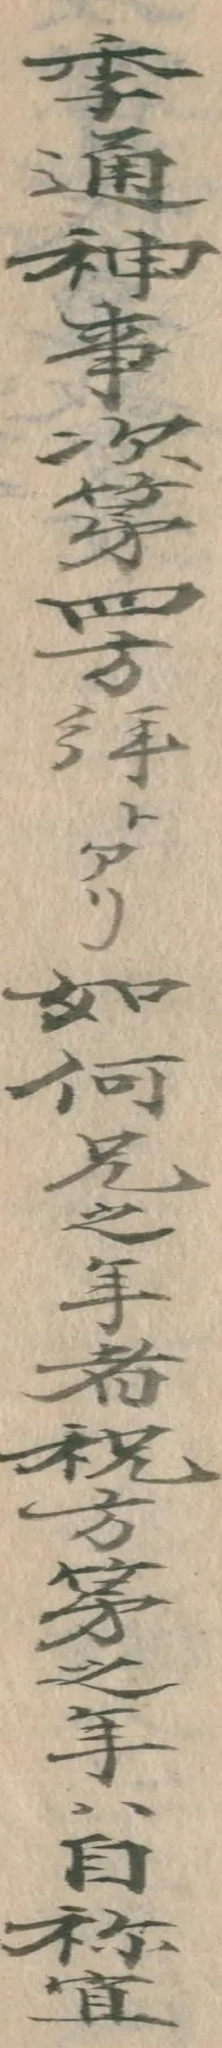季通神事次第四方拝トアリ如何兄之年者祝方第之年ハ自祢宜
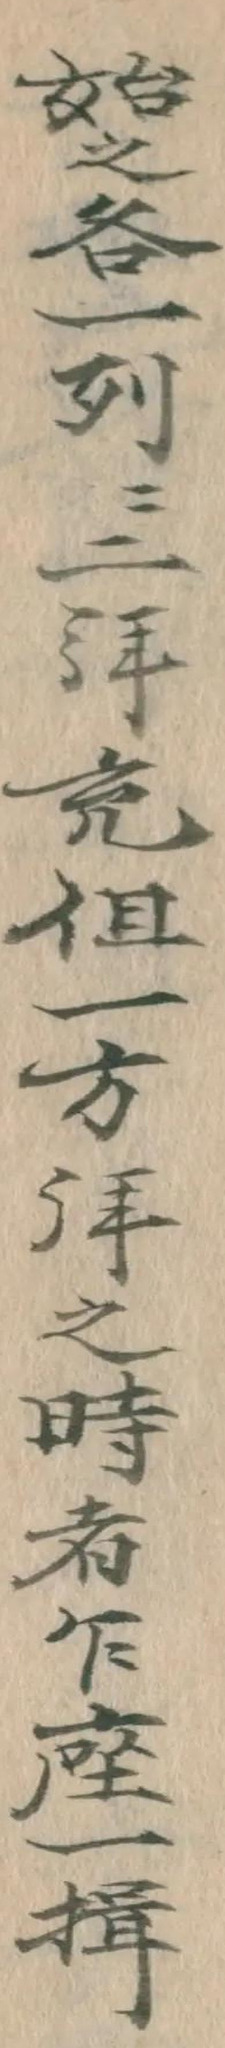始之各一列ニ二拝充但一方拝之時者乍座一揖
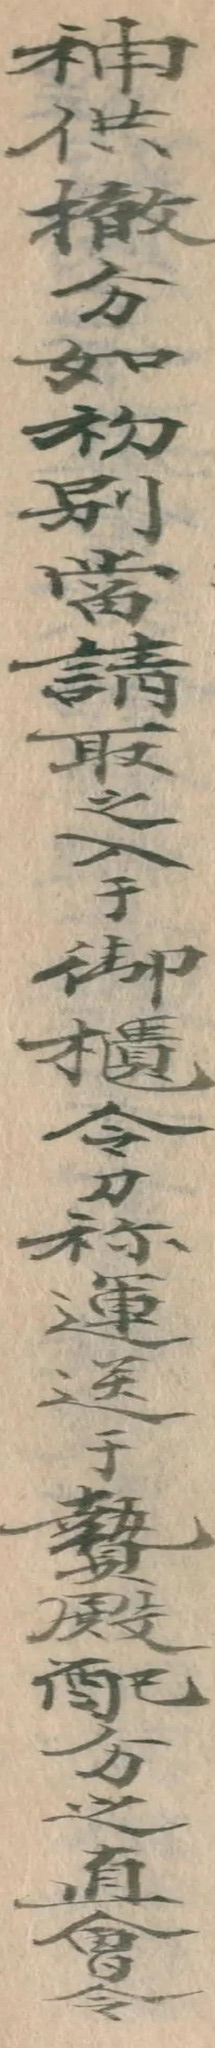神供撤分如初別当請取之入于御櫃令刀祢運送手贄殿配分之直会令
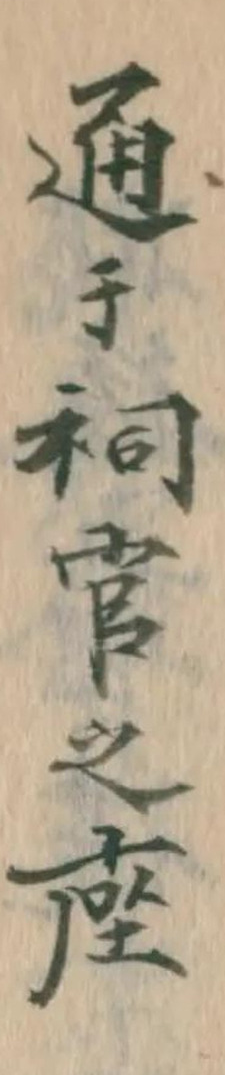通于祠官之座
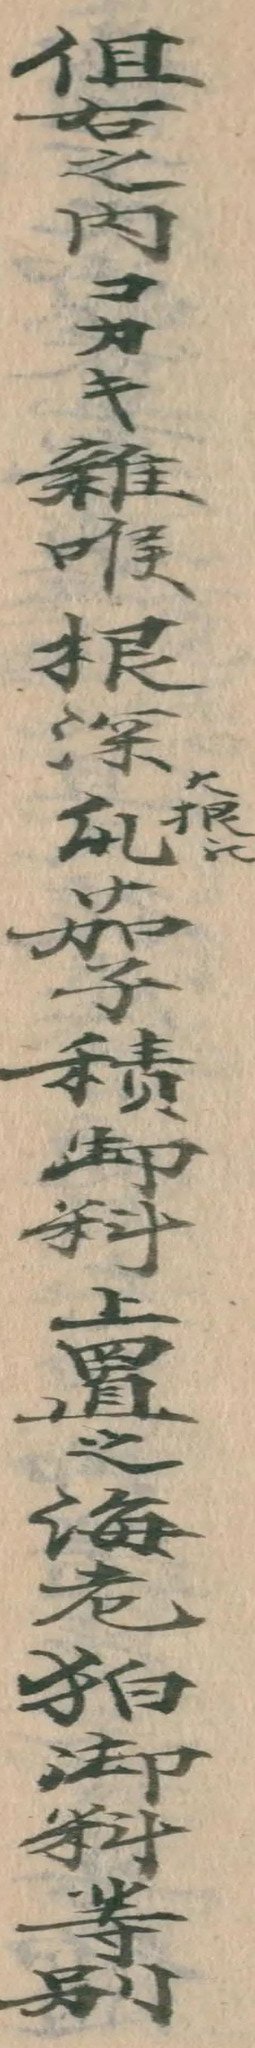但右之内コカキ雑喉根深瓜茄子積御料上置之海老狛御料等別
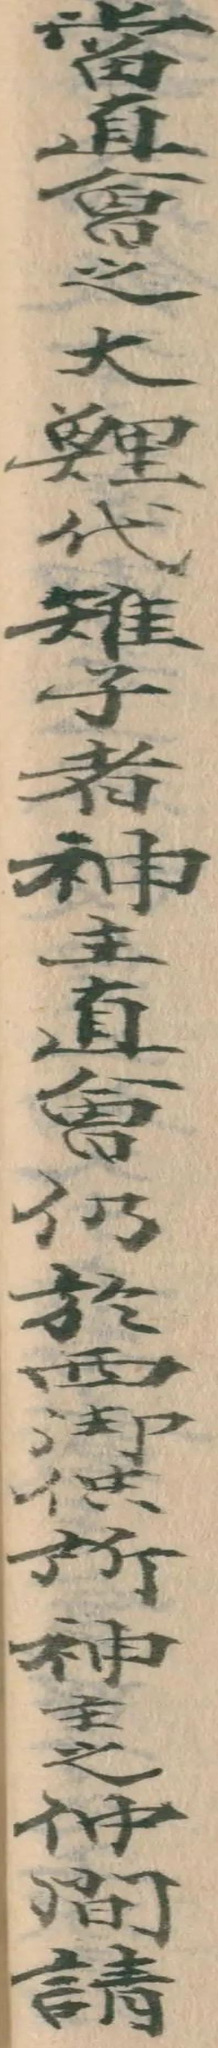当直会之大鯉代雉子者神主直会仍於西御供所神主之仲間請
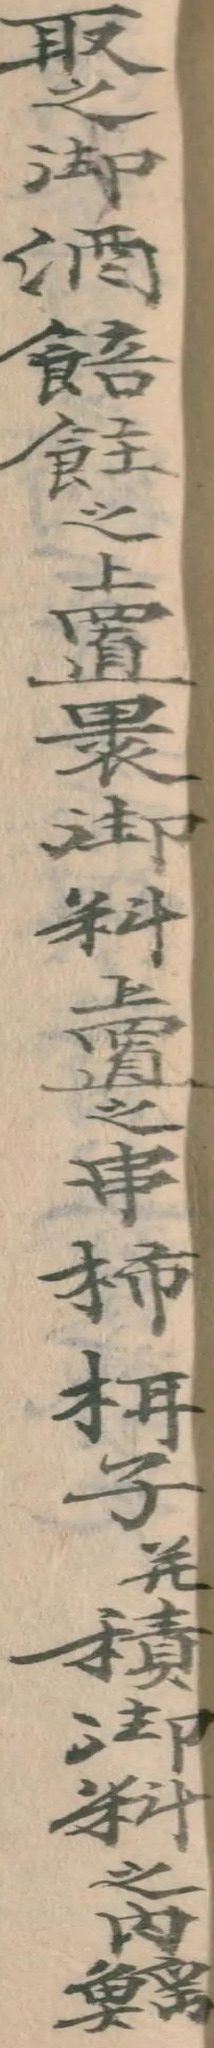取之御酒餢飳之上置褁御料上置之串柿柑子并積御料之内鰩
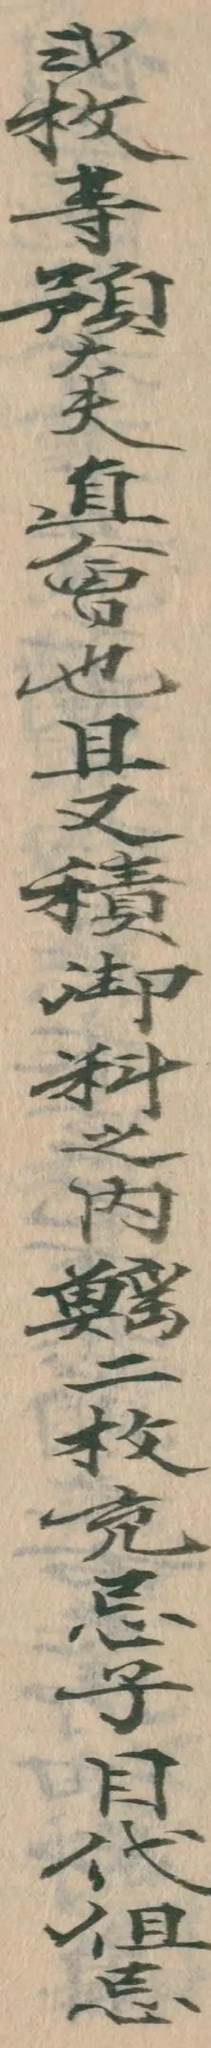弐枚等預大夫直会也且又積御料之内鰩二枚充忌子目代但忌
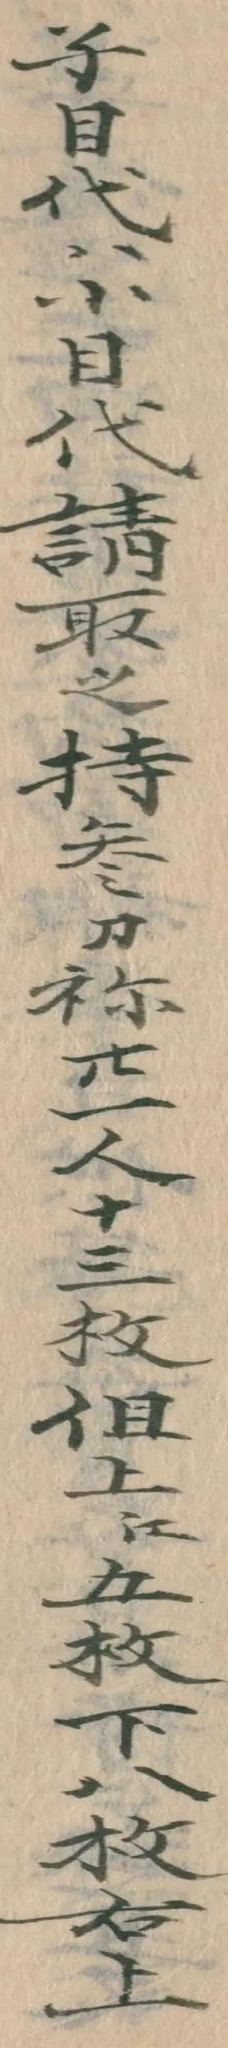子目代ハ小目代請取之持参刀祢廿一人十三枚但上江五枚下八枚右上
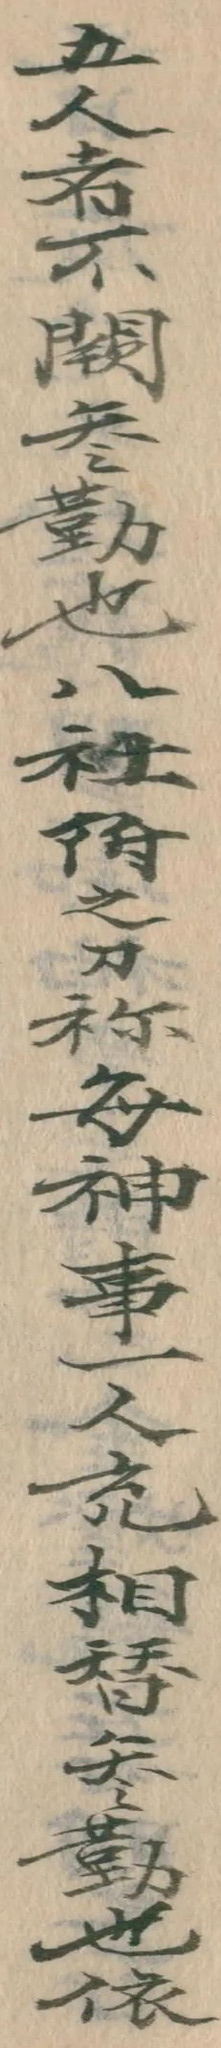五人者不闕参勤也八社附之刀祢毎神事一人充相替参勤也依
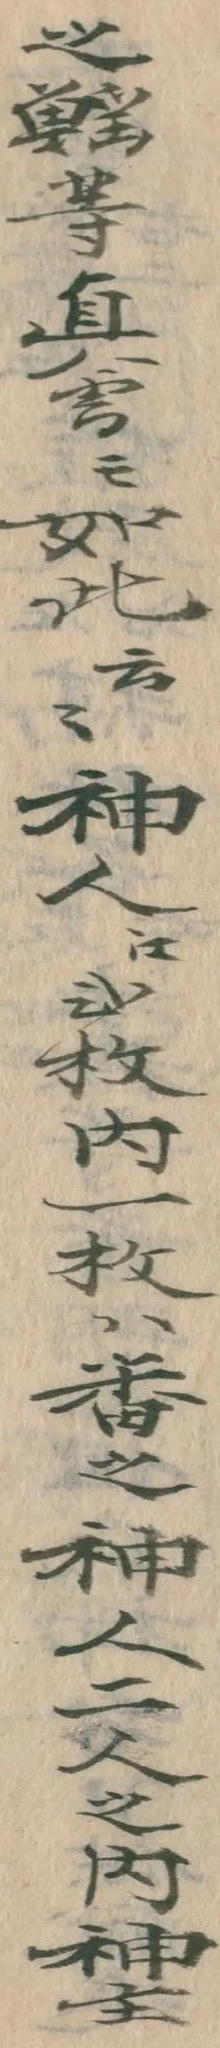之鰩等直会モ如此云々神人江弐枚内一枚ハ番之神人二人之内神主
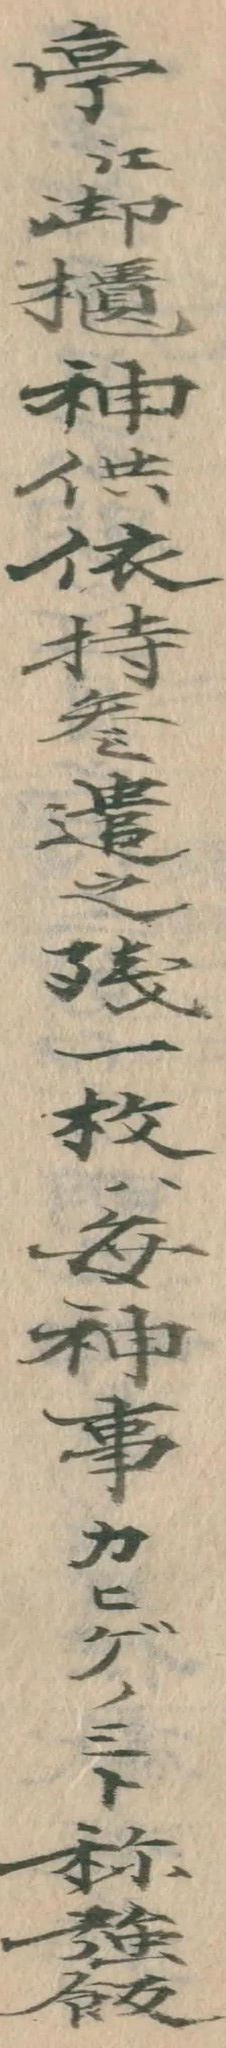亭江御櫃神供依持参遣之残一枚ハ毎神事カヒゲノミト称強飯
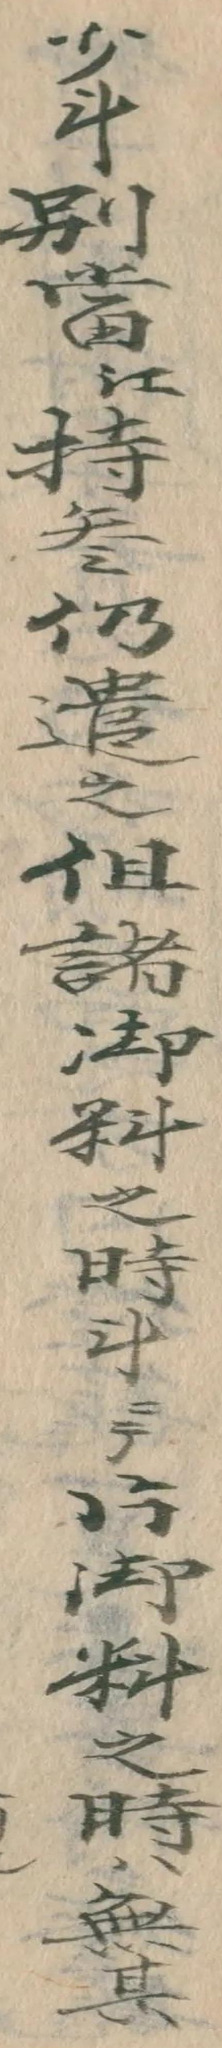少計別当江持参仍遣之但諸御料之時計ニテ片御料之時ハ無其
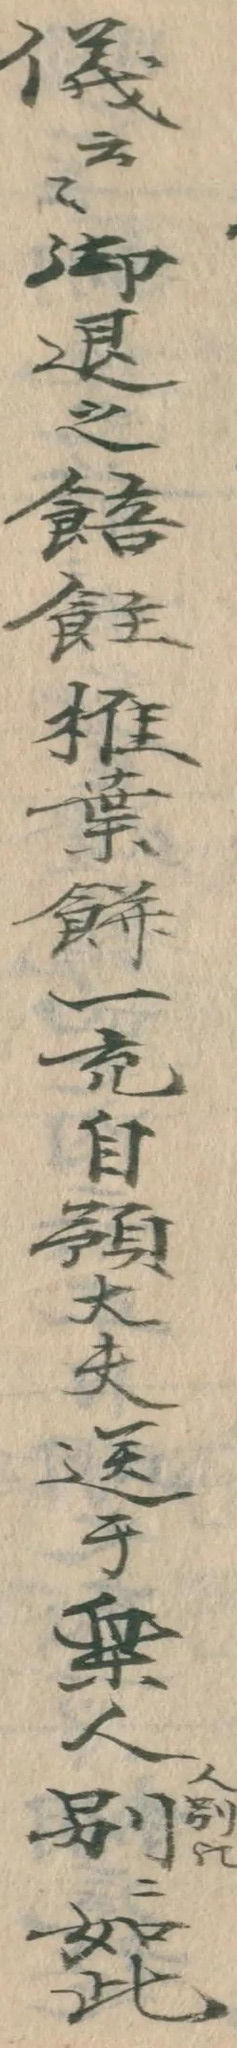儀云々御退之餢飳椎葉餅一充自預大夫送于楽人別ニ如此
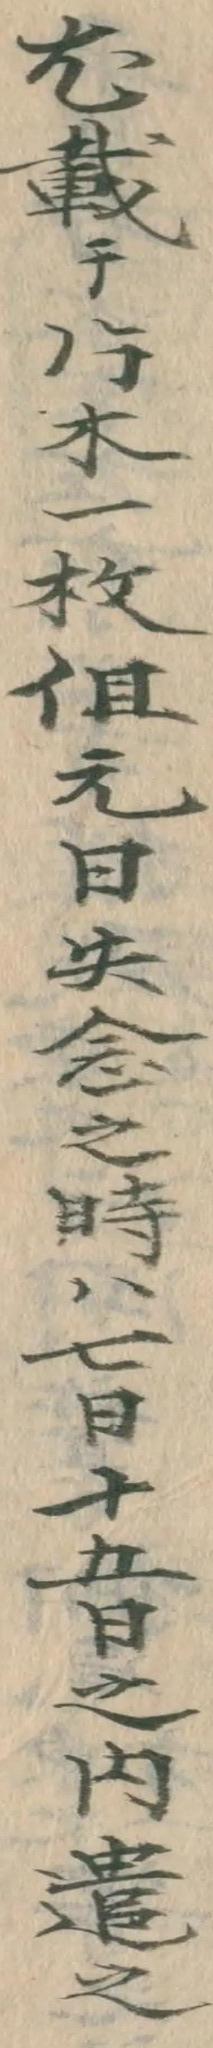尤載于片木一枚但元日失念之時ハ七日十五日之内遣之

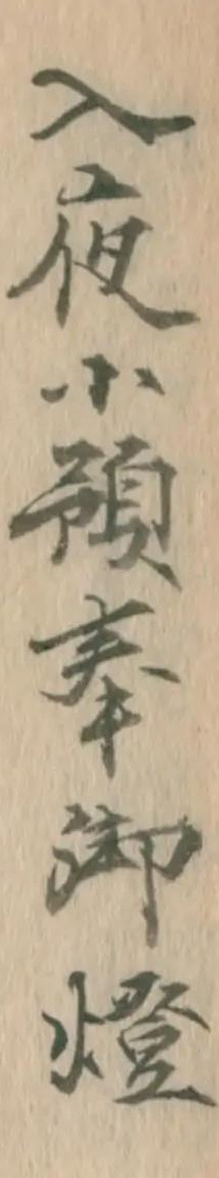入夜小預奉御燈
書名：賀茂社記録. 第9冊
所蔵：国立国会図書館 National Diet Library, JAPAN
